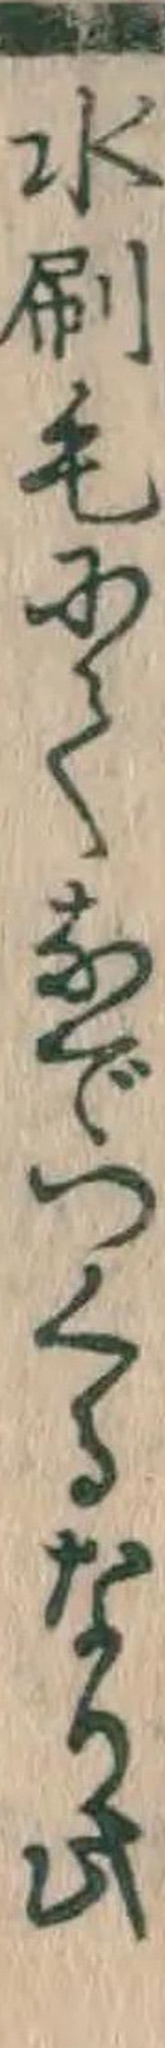水刷毛にてなでつくるなり此
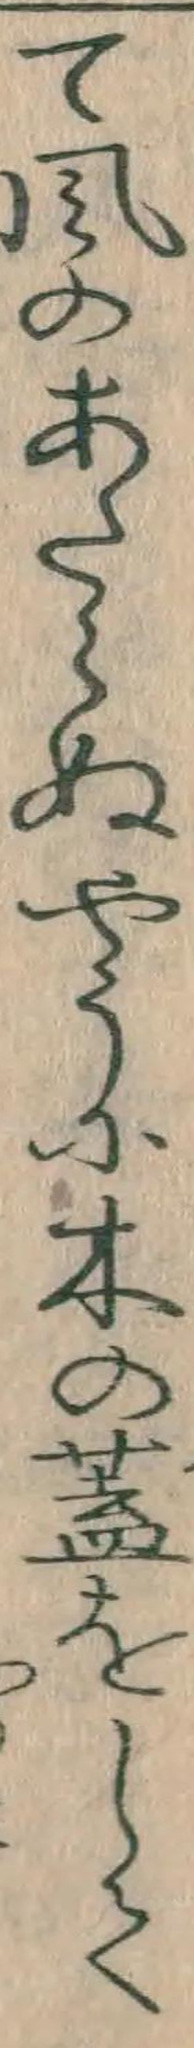て風のあたらぬやうに木の蓋をして
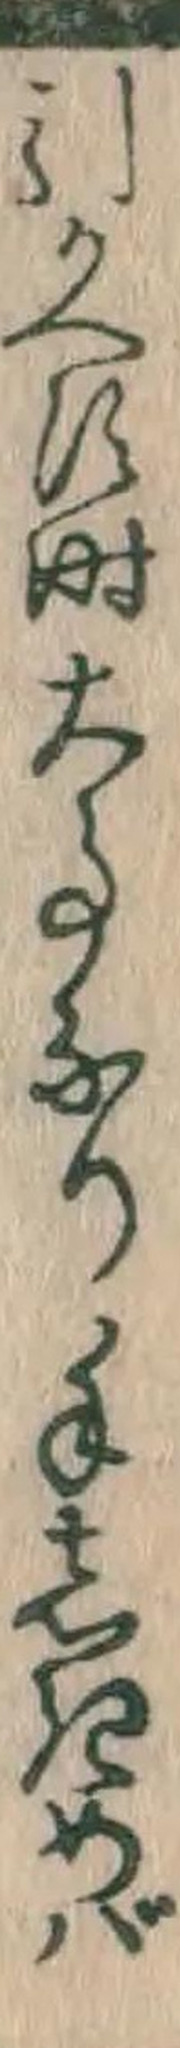引かへす時大事なり手しきめば
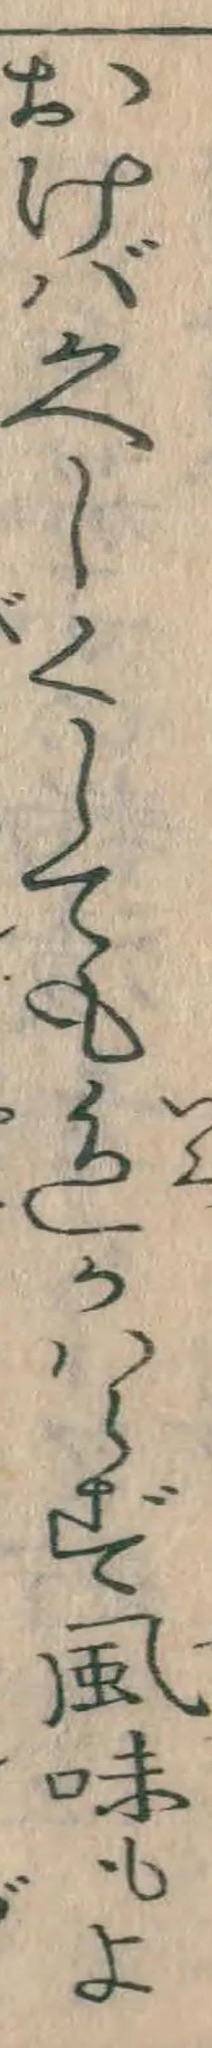おけば久しくしても色かはらず風味もよ
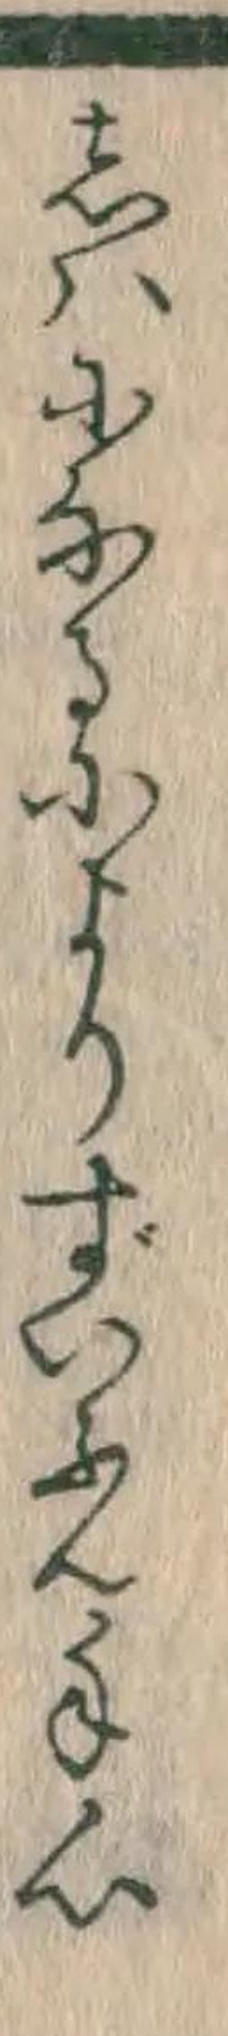しはになるによりずいふん手心
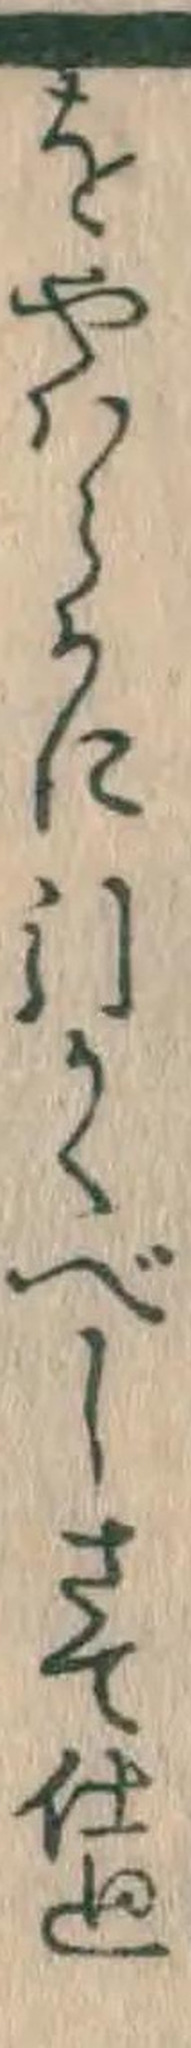をやはらかに引かくべしさて仕廻
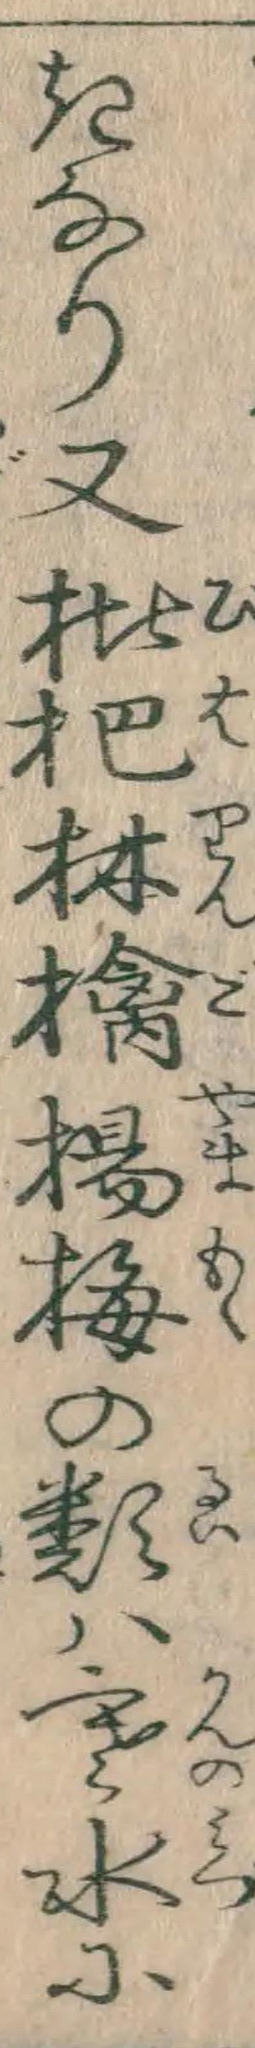きなり又枇杷林檎楊梅の類は寒水に
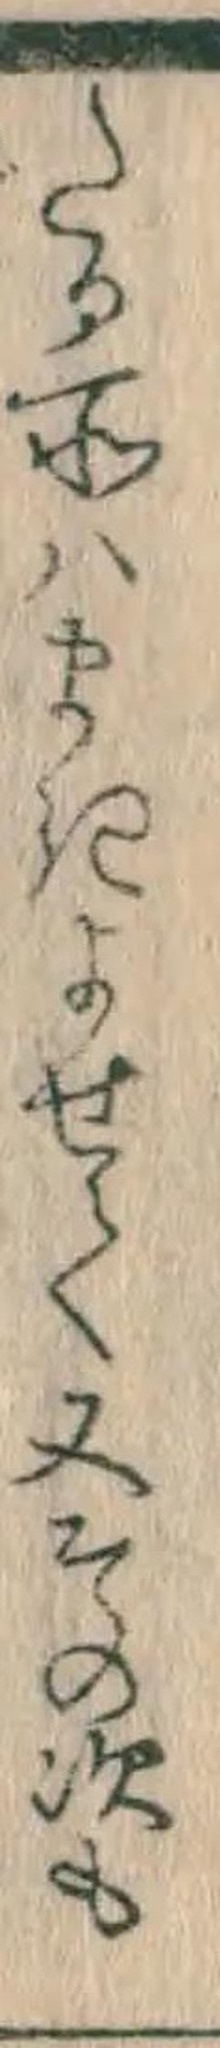たる所はまきよせて又その次も
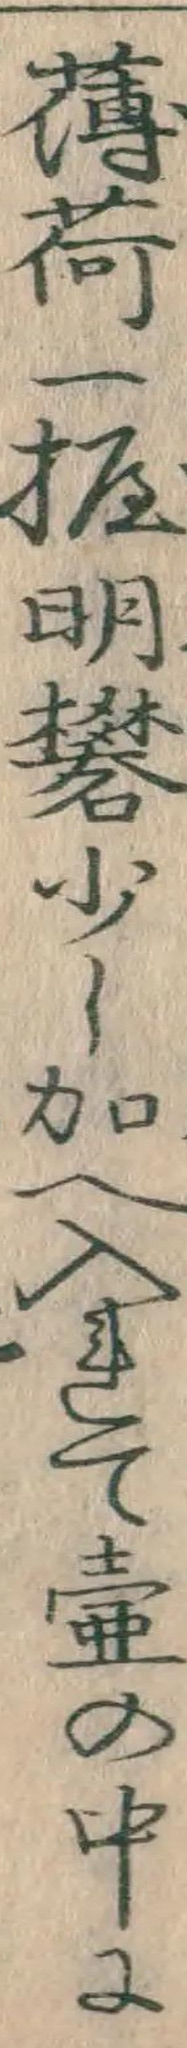薄荷一握明礬少し加へ入れて壺の中に
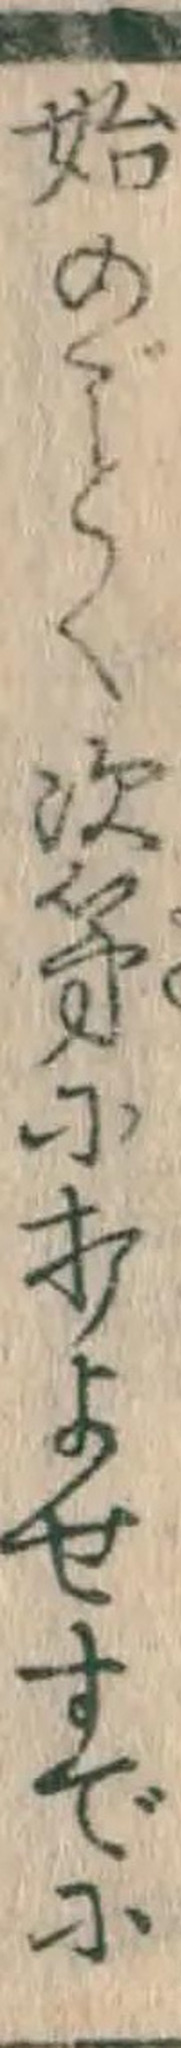始のごとく次第に打よせすでに
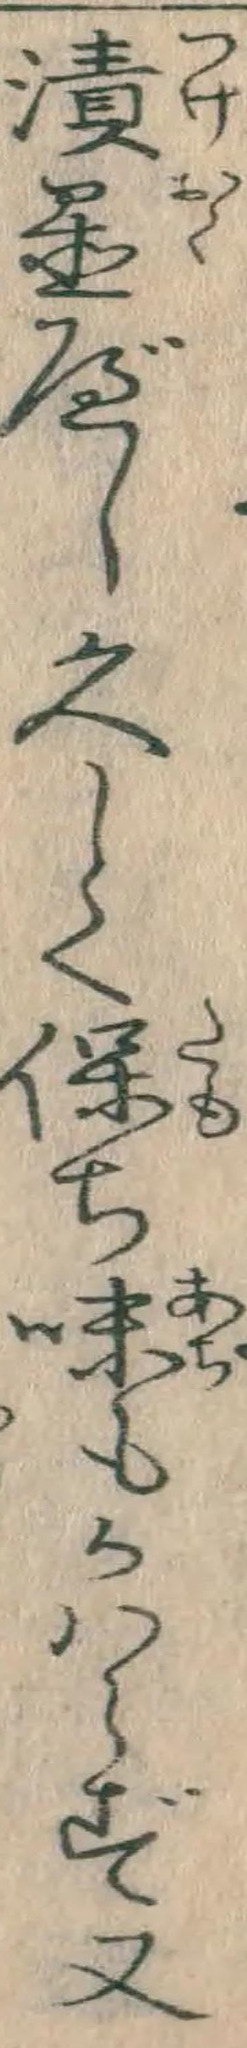漬置べし久しく保ち味もかはらず又
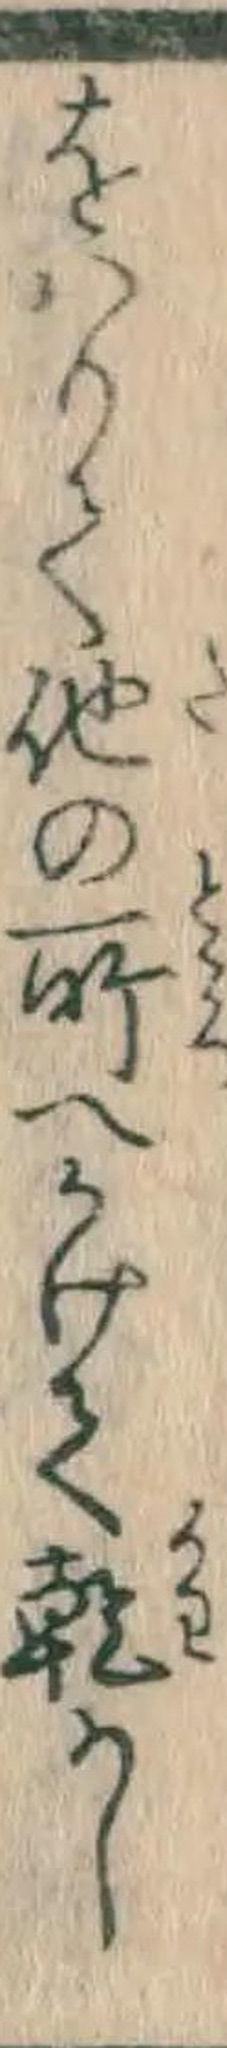をはりて他の所へかけて乾かし
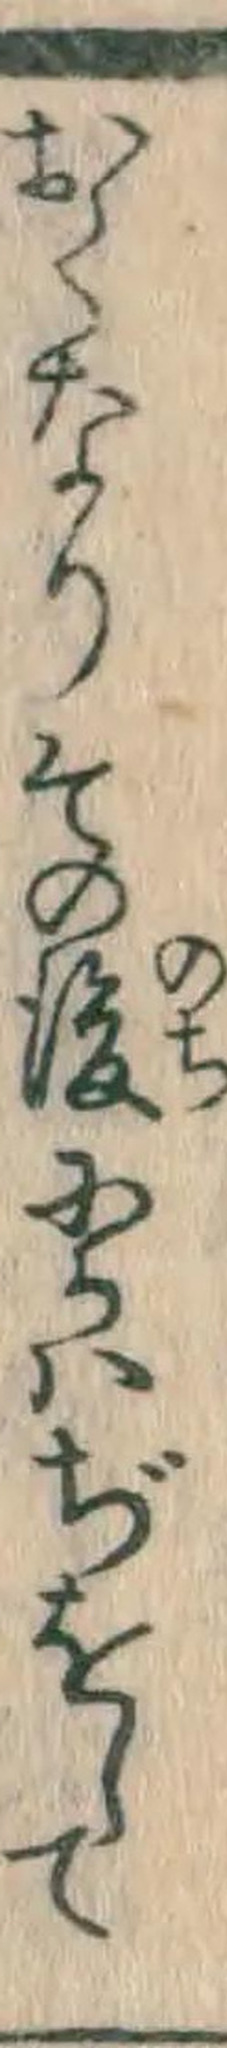おくなりその後にかはぢをして
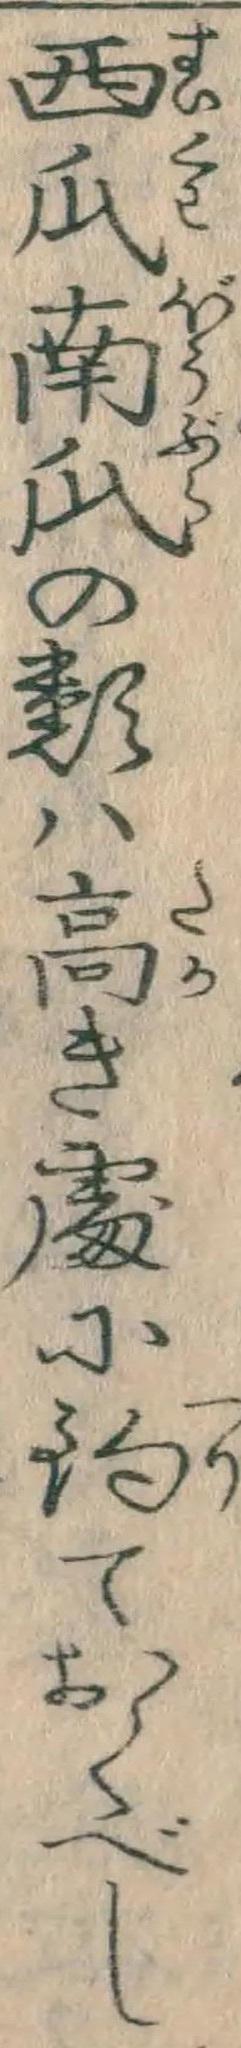西瓜南瓜の類は高き処に釣ておくべし
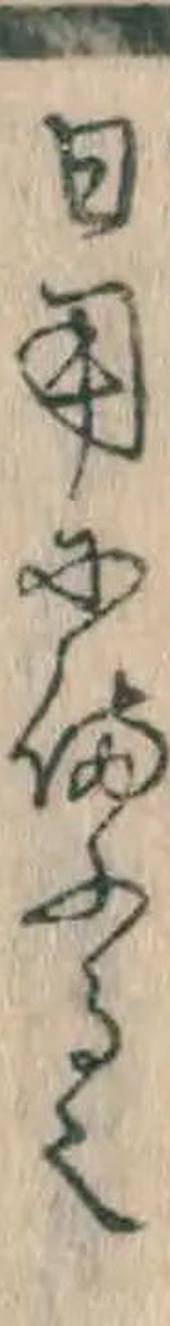日用に備ふる也
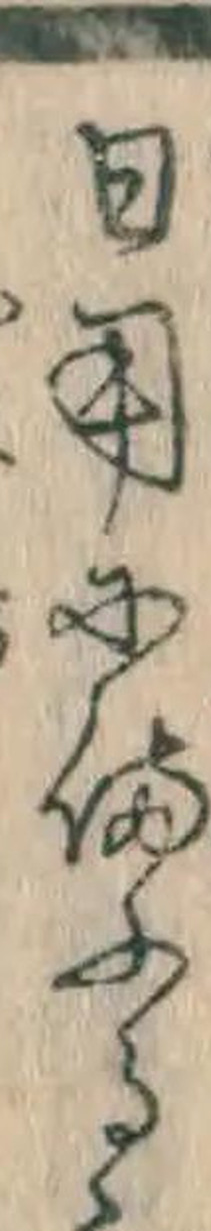日用に備ふる也
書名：広益秘事大全 3巻. [2]
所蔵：国立国会図書館 National Diet Library, JAPAN
